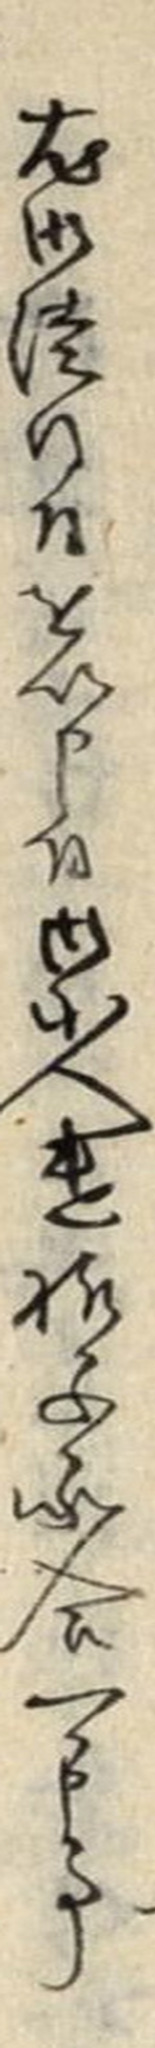尤御徒目付を以申付御小人遣様子承合可申事
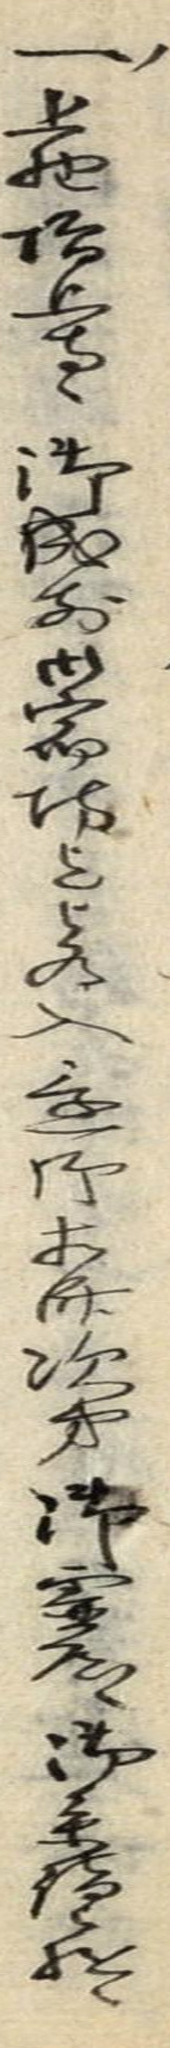一上野増上寺へ御成前御宿坊迄被為入還御相済次第御霊屋へ御参詣被遊候
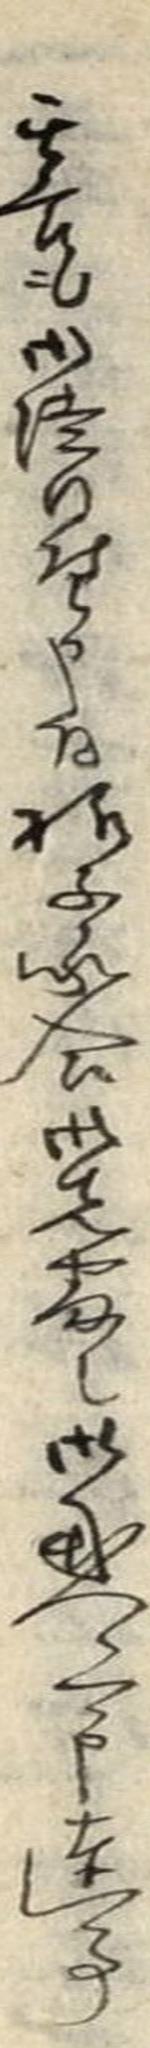其節も御徒目付へ申付様子承合御先番之御用人へ可申達候事
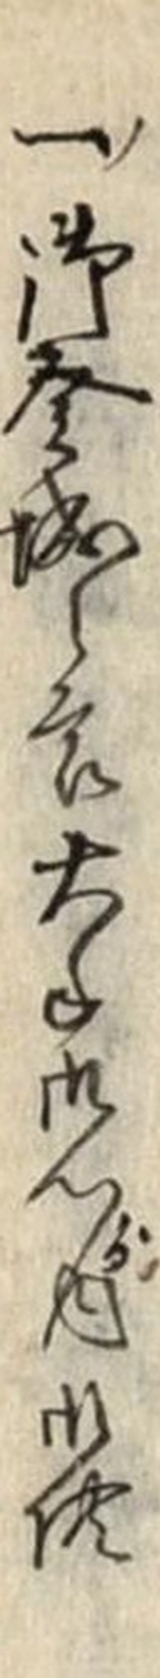一御登城之節大手御門ゟ内御供
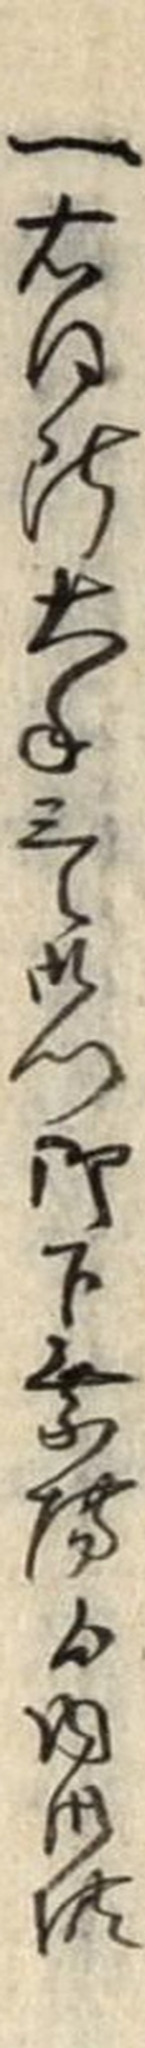一右同断大手三之御門御下乗場ゟ内御供

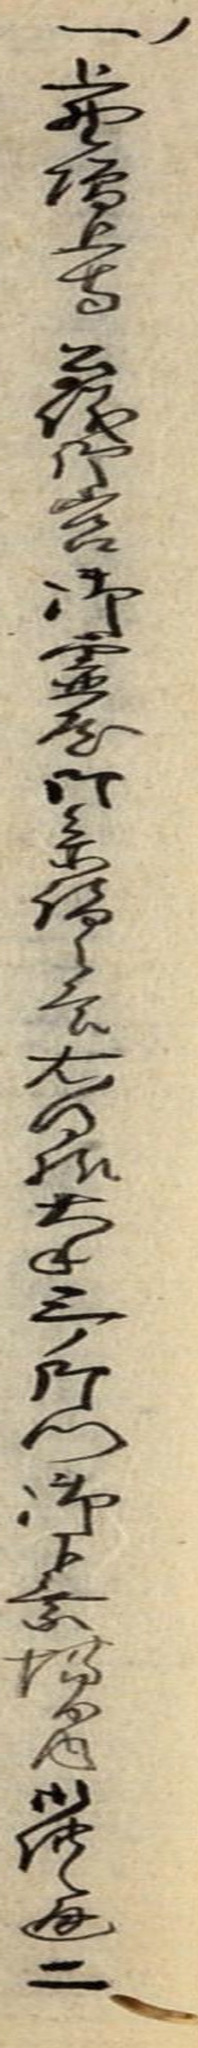一上野増上寺公儀御宮御霊屋御参詣之節右同様大手三之御門御下乗場ゟ内御供之通二
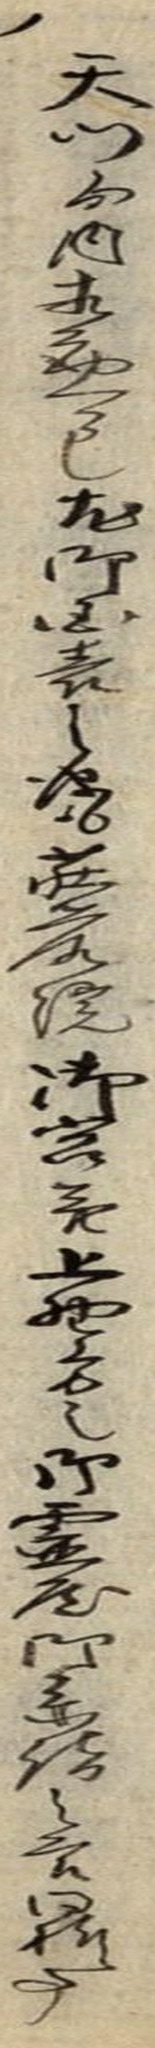天門ゟ内相勤可申候尤御国表之儀も荘厳院御宮并上野方之御霊屋御参詣之節同様之事
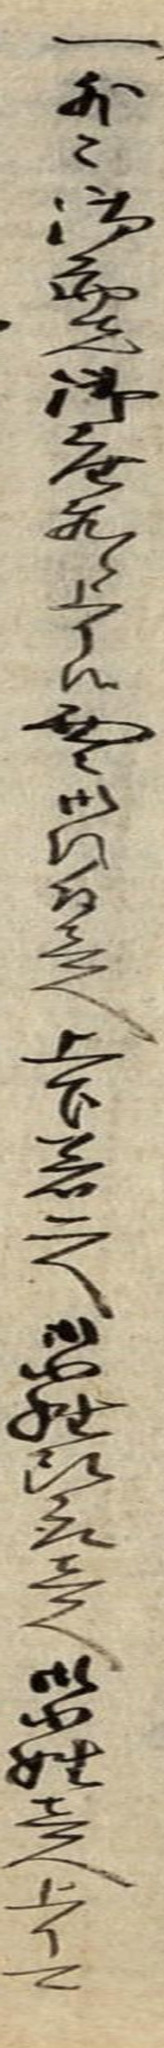一外々御勤先御座敷へ上り候面々御目付壱人上下着二人御小姓頭取壱人御小姓壱人上り可
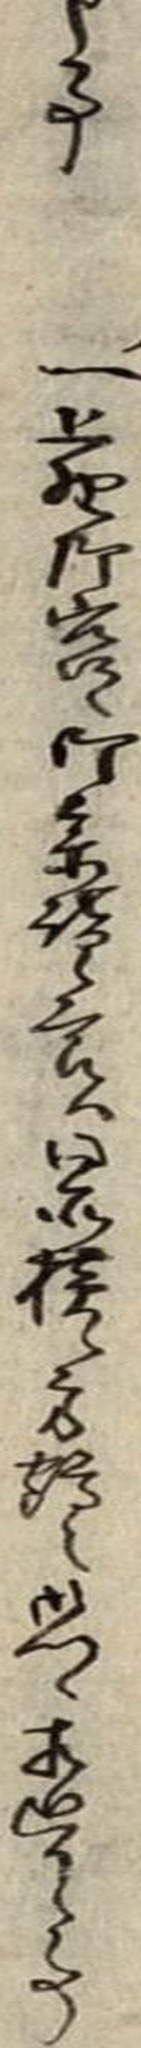申事一上野御宮へ御参詣之節は同所横之方鶴之御門へ相廻り候事
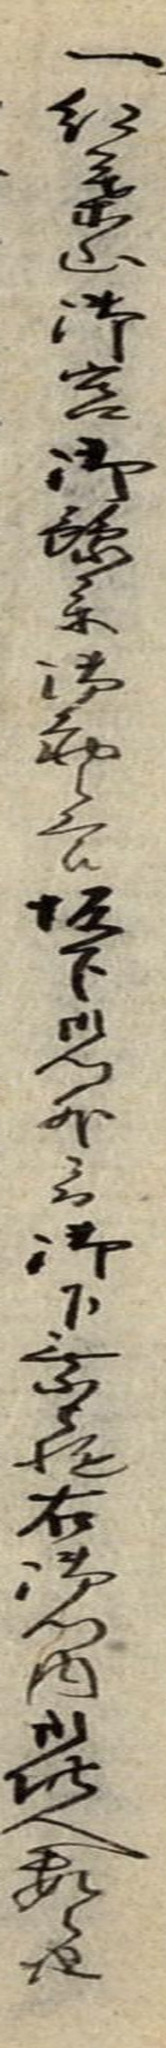一紅葉山御宮御予参御勤之節坂下御門外にて御下乗被遊右御門内御供人数之儀
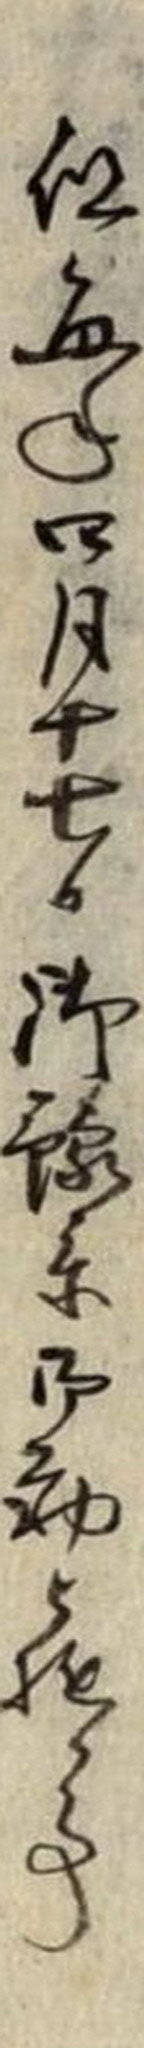但毎年四月十七日御予参御勤被遊候事
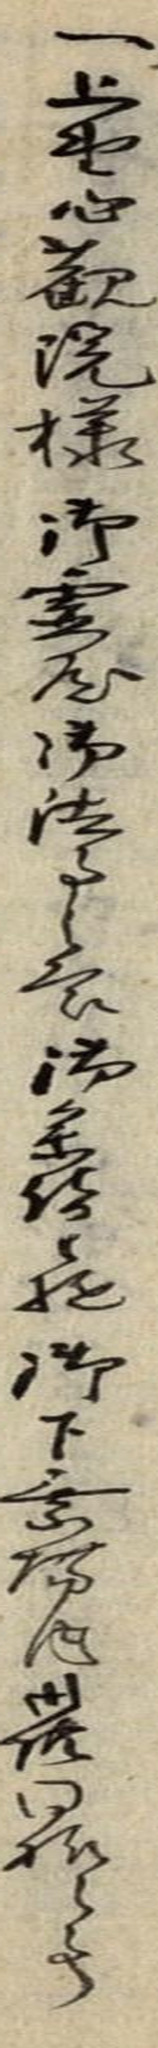一上野心観院様御霊屋御法事之節御参詣被遊御下乗場内御供同様之事
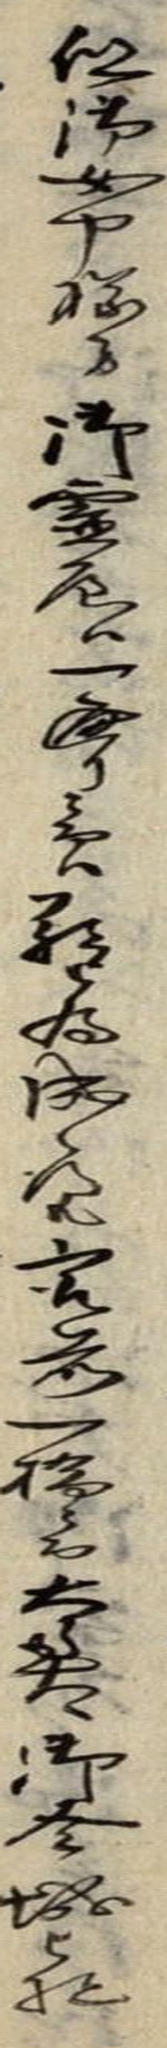但御女中様方御霊屋は一通りにては難被為成候得共最前一橋にて大奥へ御登城被遊
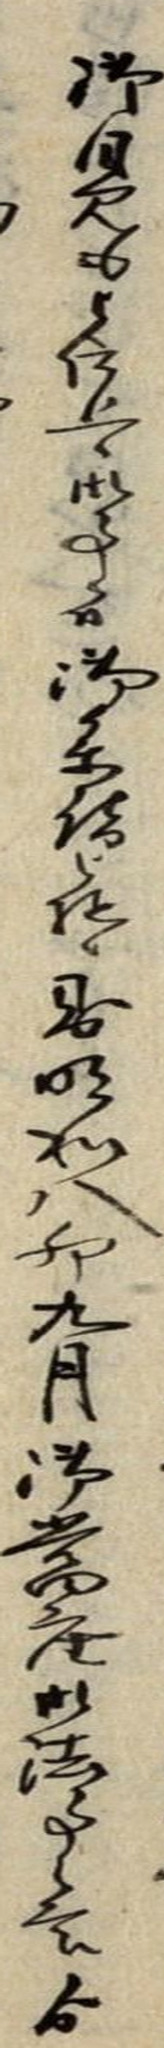御目見も被仰上候事に付御参詣被遊候則明和八卯年九月御当座御法事之節ゟ
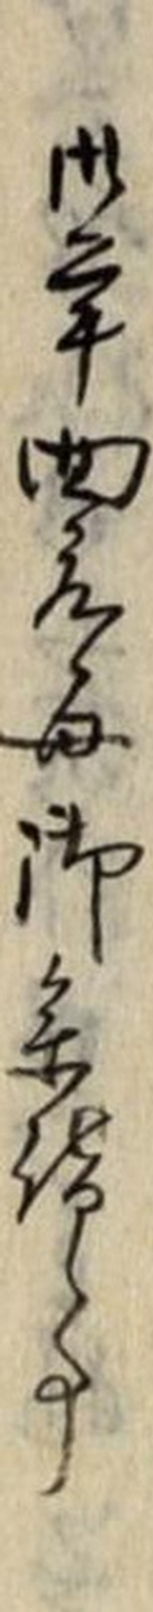御年回度毎御参詣之事
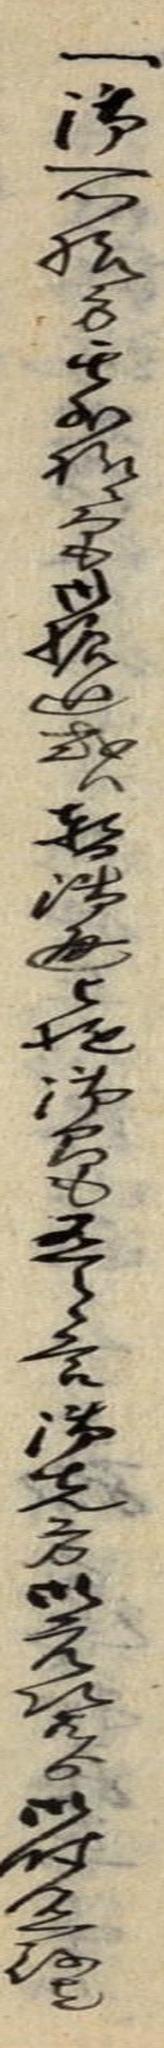一御一門様方其外様にても御振廻或は暫御通被遊御間も有之候節御先方御取次共ゟ御時宜致迄
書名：三都并道中之部
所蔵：福井県文書館 Fukui Prefectural Archives
